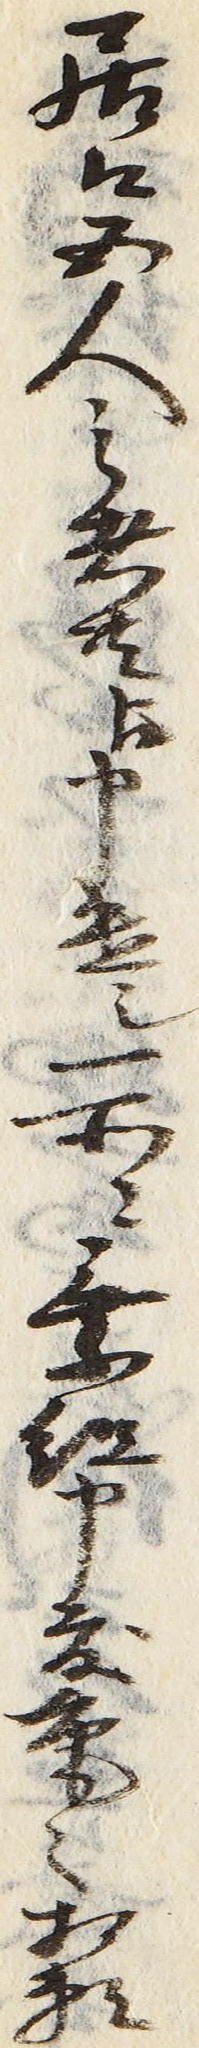居候五人之者共江申遣シ一所ニ乗組申度色々相頼
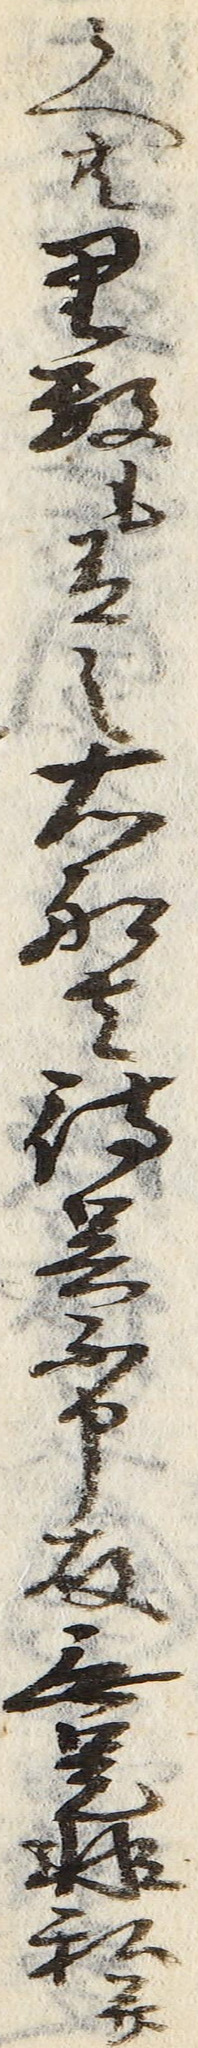候へ共里数も有之右舩者待呉不申故是非私幷
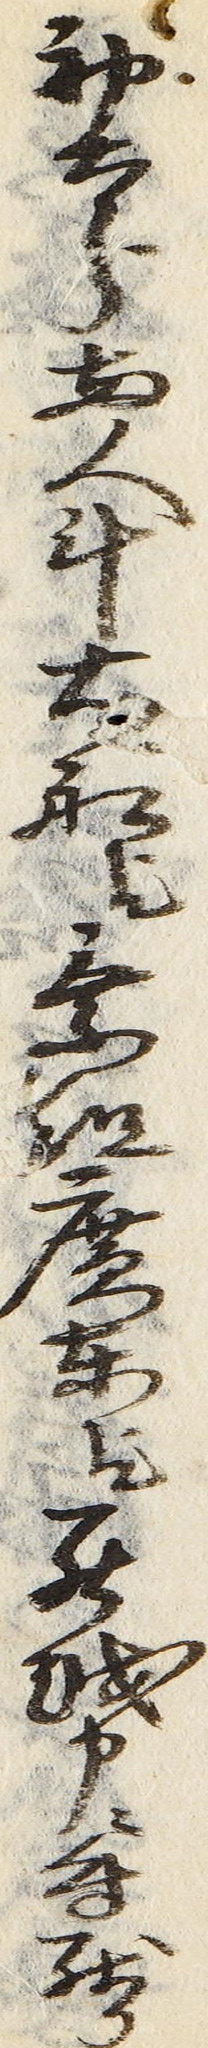初太郎両人斗右舩江乗組廣東江罷越申ニ付残り
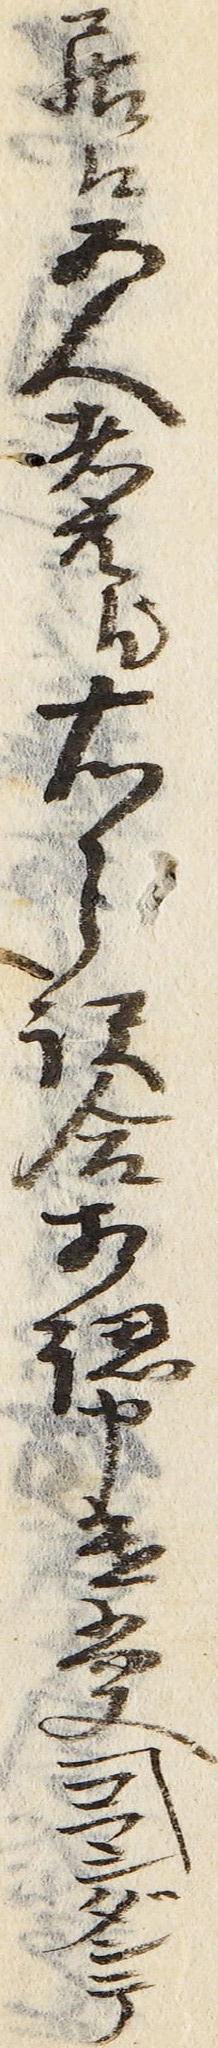居候五人者共江右之訳合相認申遣尚又「コマンダンテ
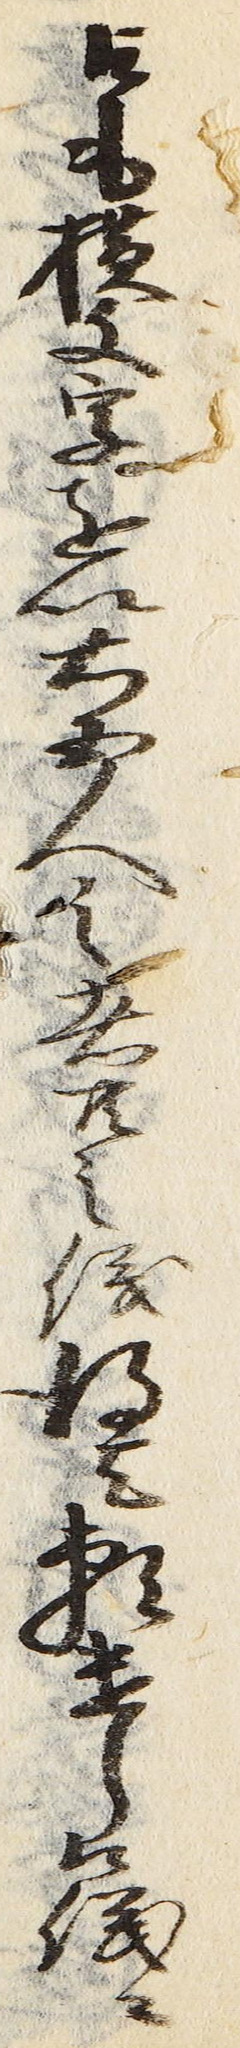江も横文字を以右五人之者共之儀得と頼遣し候儀ニ
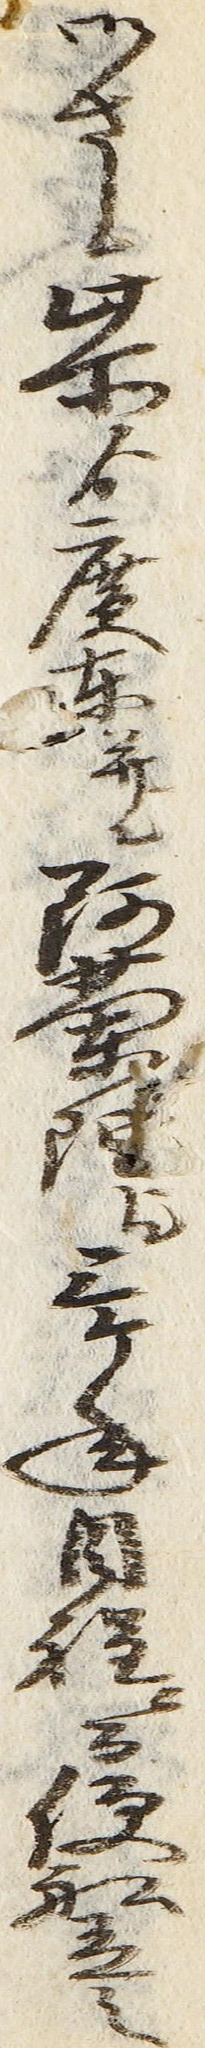御座候此所ゟ廣東幷ニ阿蘭陀江三ケ年目程ニ而便舩有之
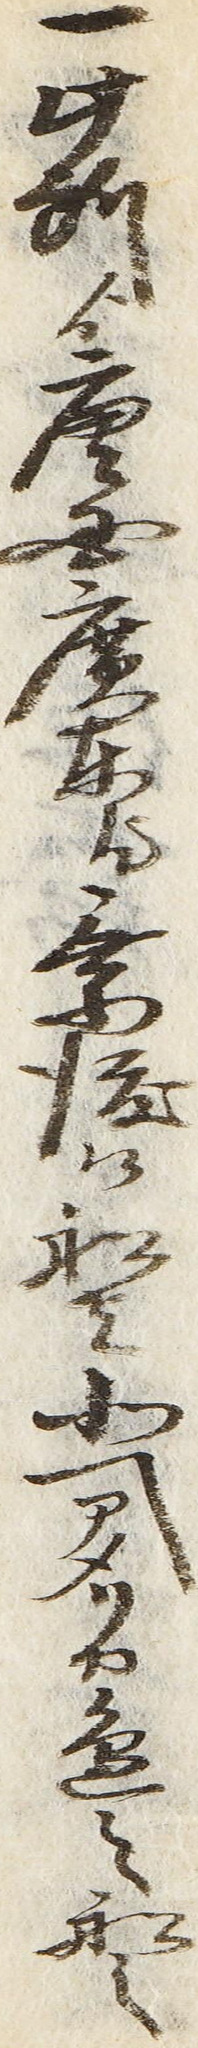一此所ゟ唐国廣東江乗渡候舩者北「アメリカ邊之舩之
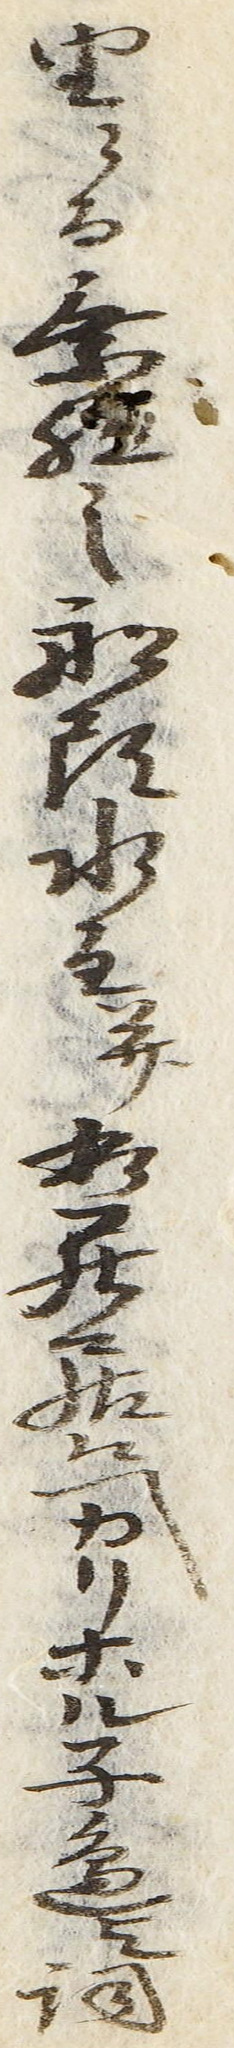由ニ而乗組之舩頭水主幷私罷居候「カリホル子邊と詞
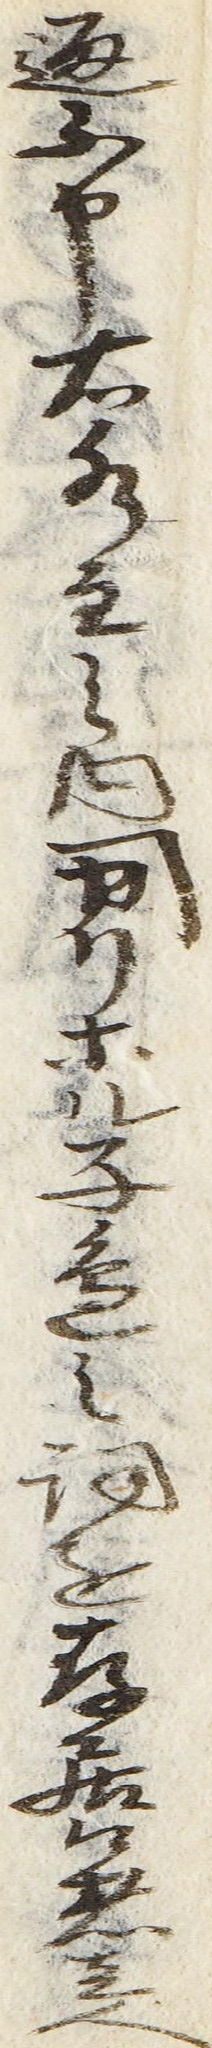通不申右水主之内「カリホル子邊之詞を存居候者壱人
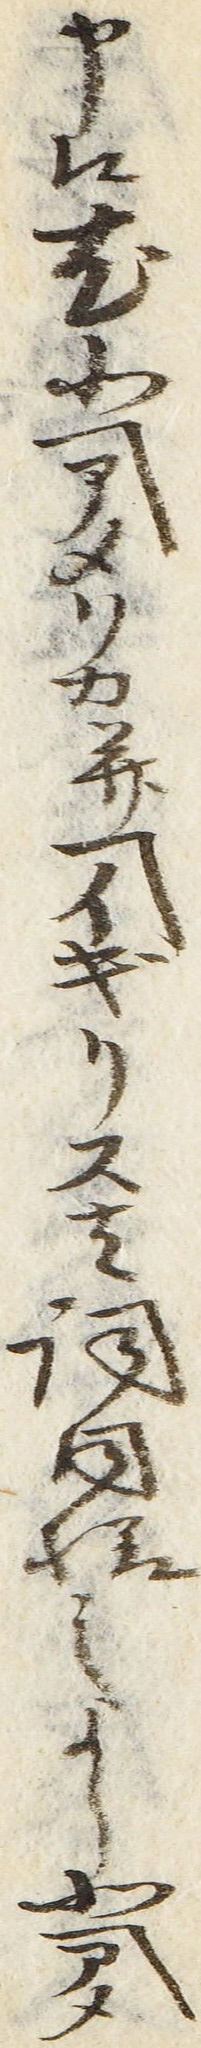申候尤北「アメリカ幷「イギリス者詞同様之よし「北アメ
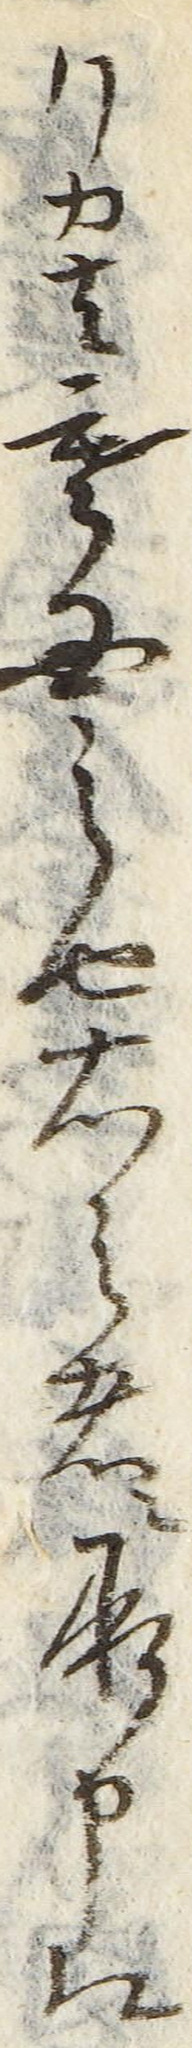リカ者寒国之由右之者ニ承申候

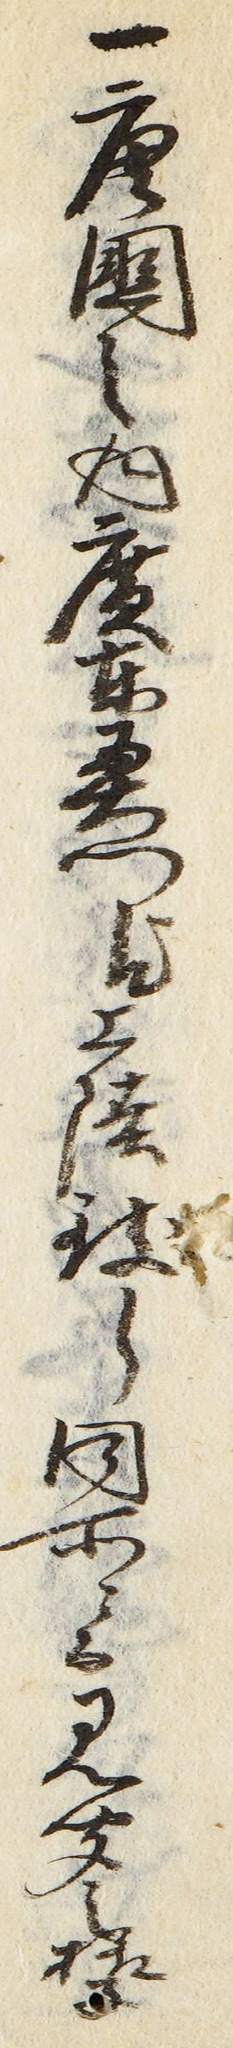一唐國之内廣東奥門江上陸致し同所ニ而見聞之様子
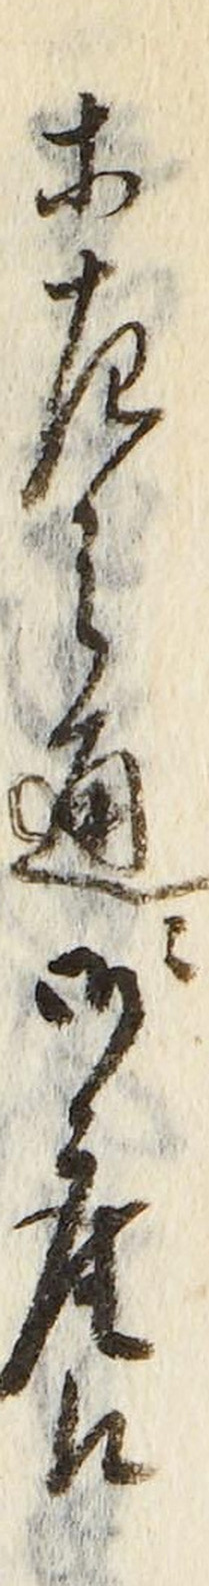等左之通ニ御座候
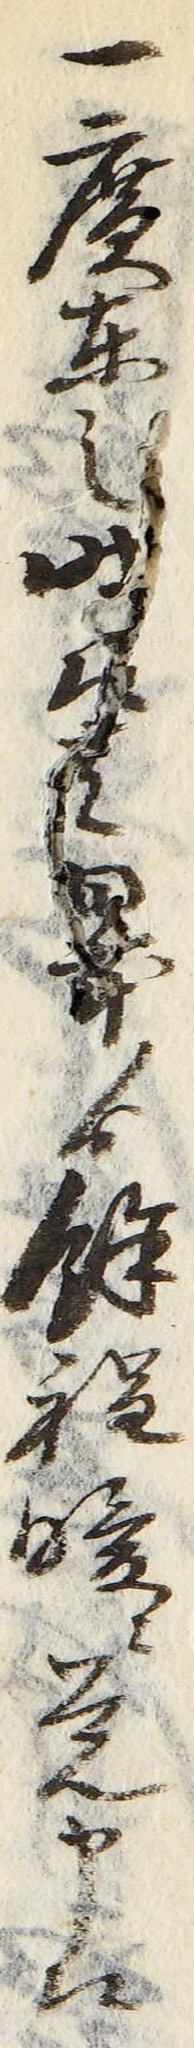一廣東之時節者日本ゟ餘程暖ニ覚申候
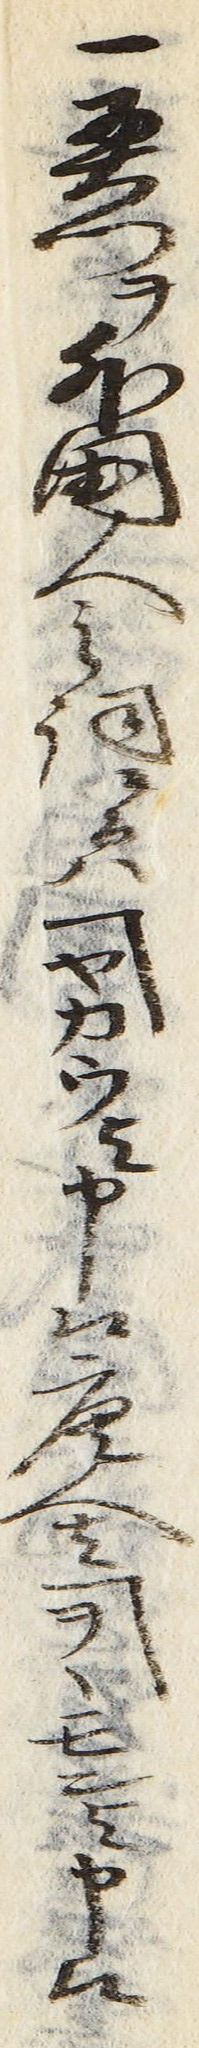一奥門ヲ外国人之詞ニテハ「ヤカウと申候唐人者「ヲヽモンと申候
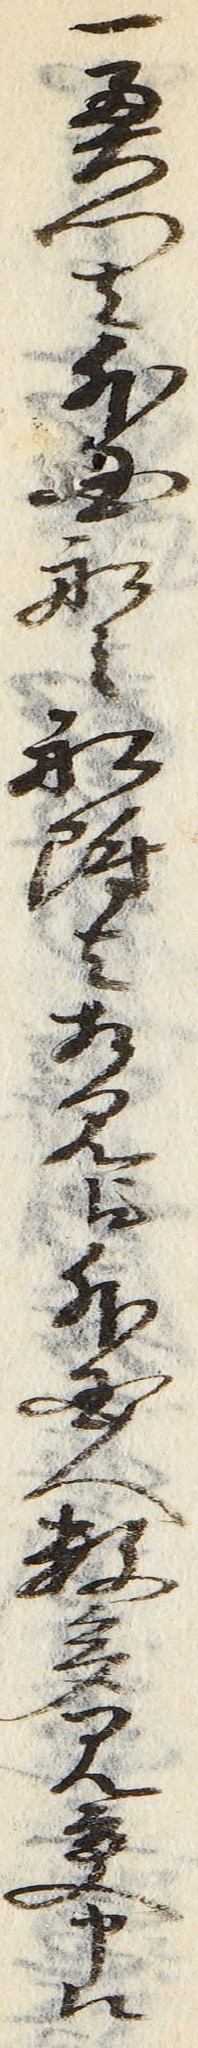一奥門者外国舩の舩附者相見江外国人数多見受申候此
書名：漂流人善助聞書
